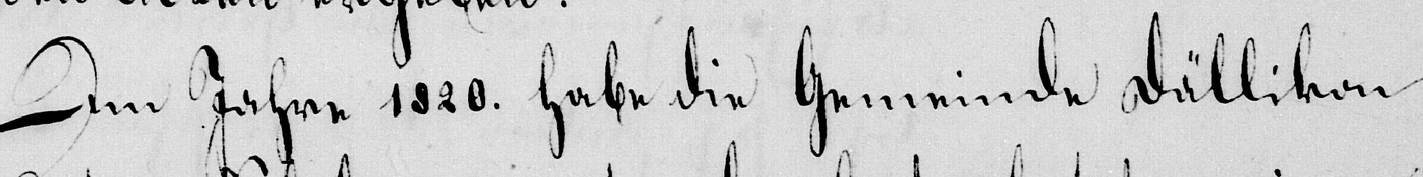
Im Jahre 1820. habe die Gemeinde Dällikon
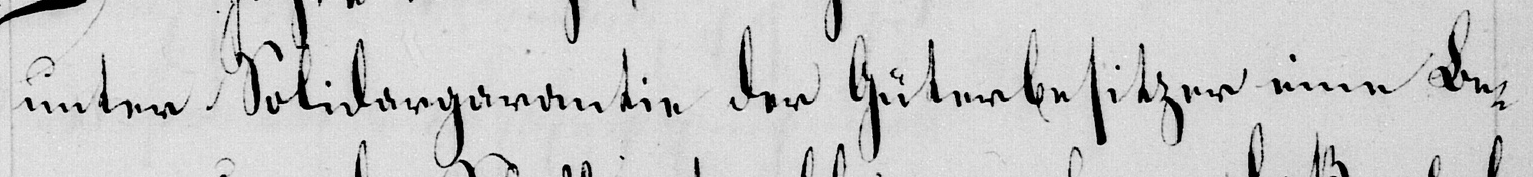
unter Solidargarantie der Güterbesitzer eine Be¬
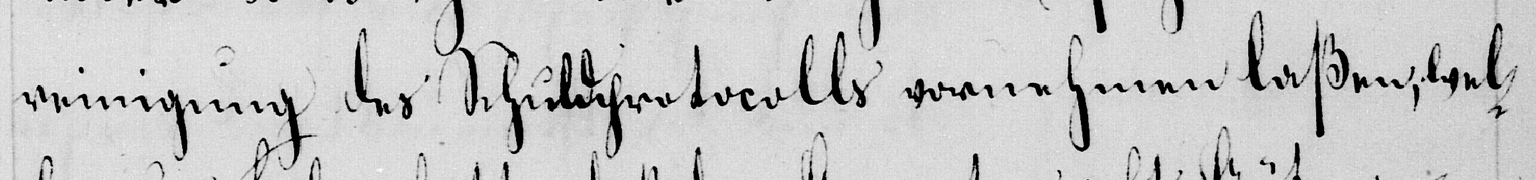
reinigung des Schuldprotocolls vornehmen laßen, wel¬
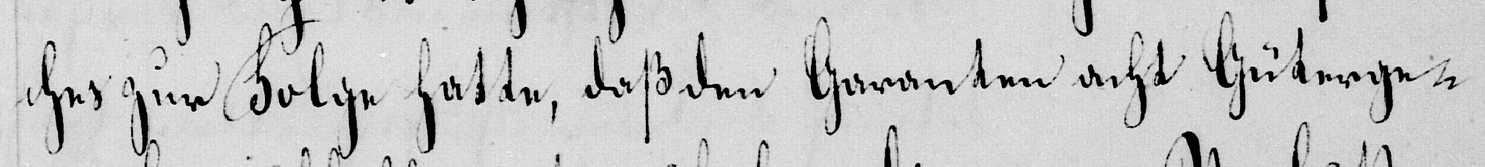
ches zur Folge hatte, daß den Garanten acht Güterge¬
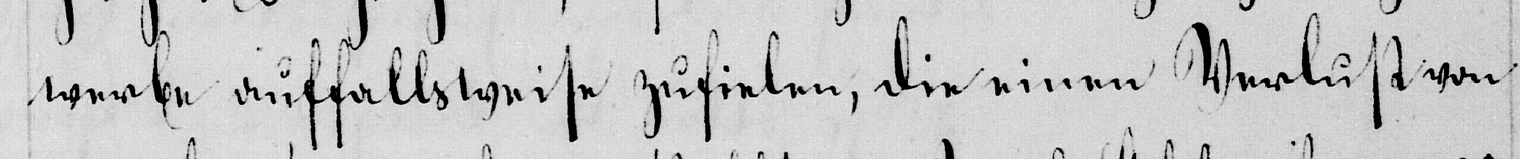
werbe auffallsweise zufielen, die einen Verlust von
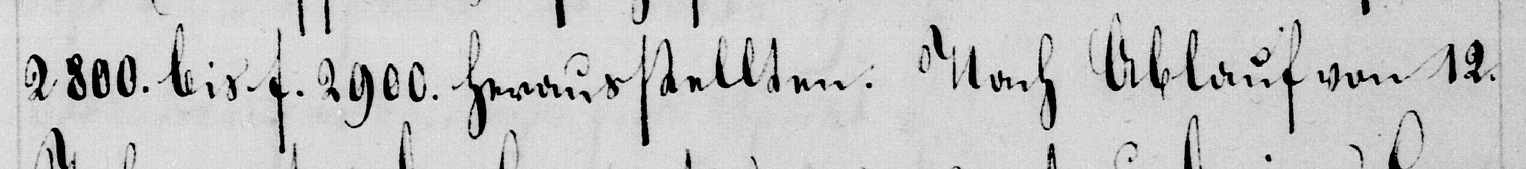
2800. bis f. 2900. herausstellten. Nach Ablauf von 12.
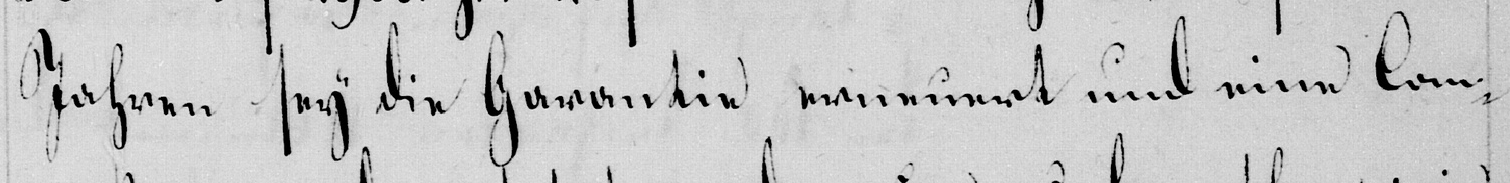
Jahren sey die Garantie erneuert und eine Com¬
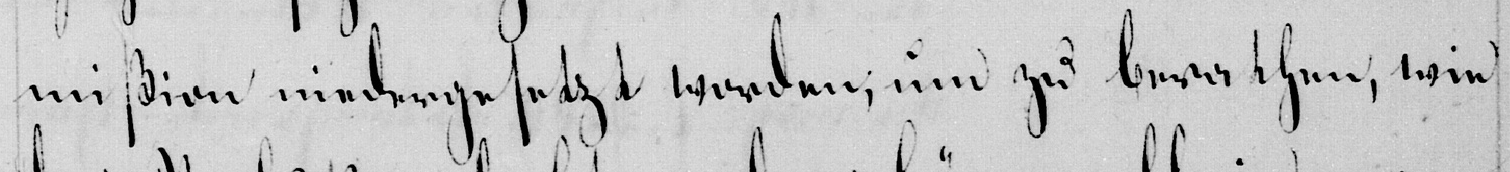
mißion niedergesetzt worden, um zu berathen, wie
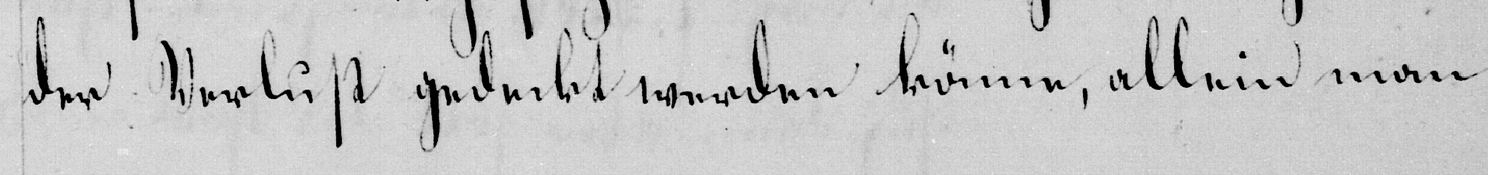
der Verlust gedeckt werden könne, allein man
